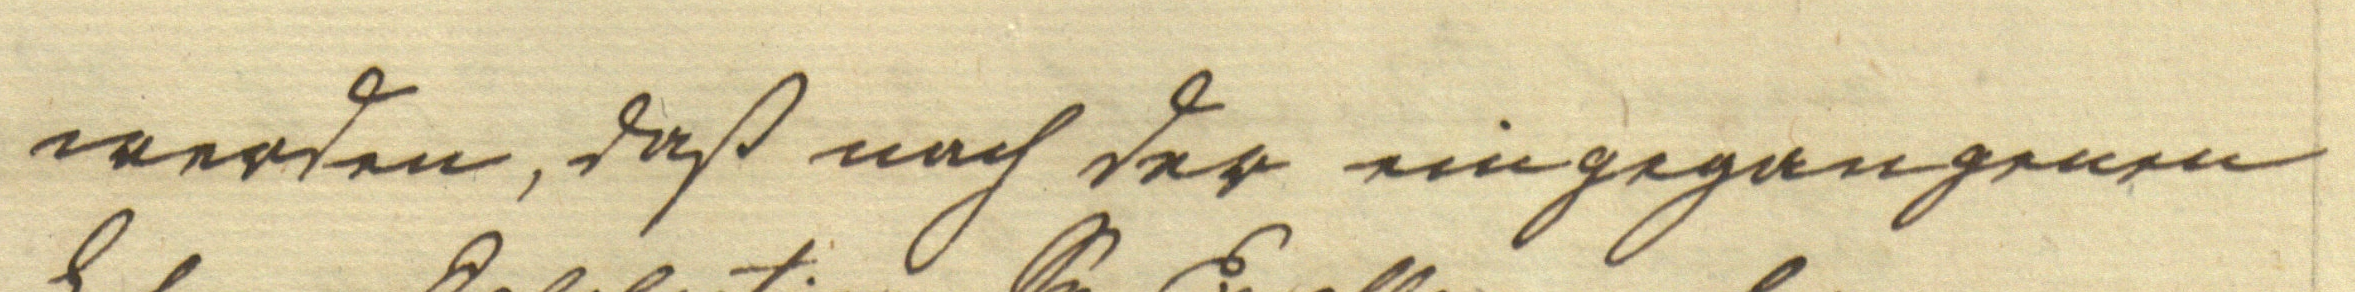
werden, daß nach der eingegangenen
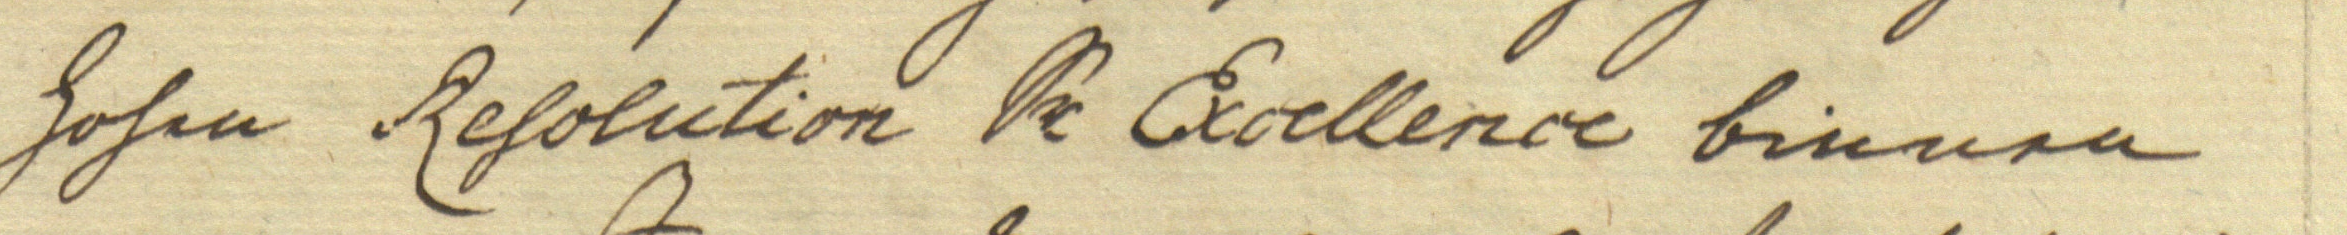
Hohen Resolution Sr Excellence binnen
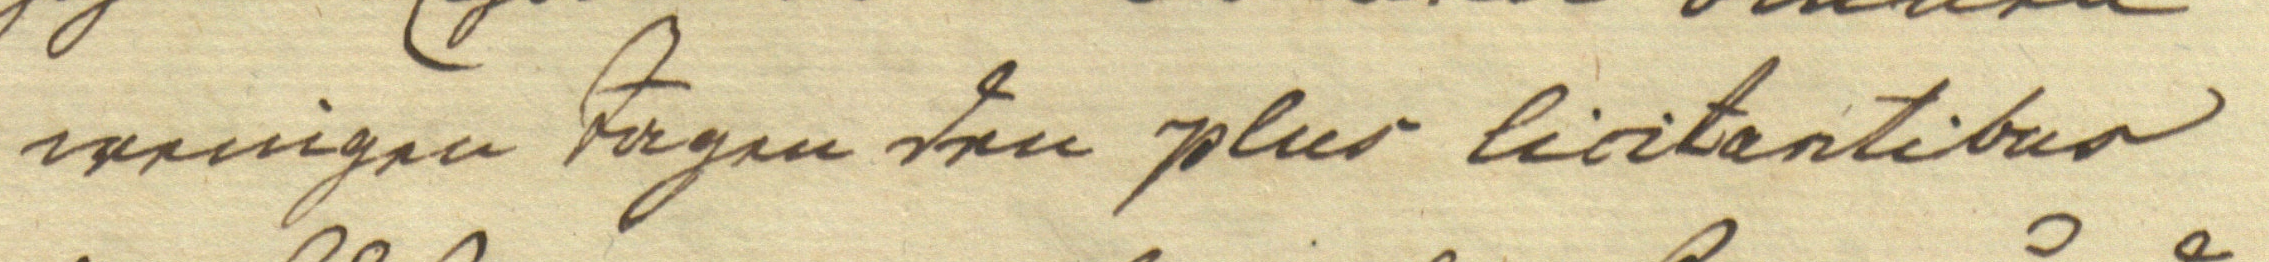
wenigen Tagen den plus licitantibus
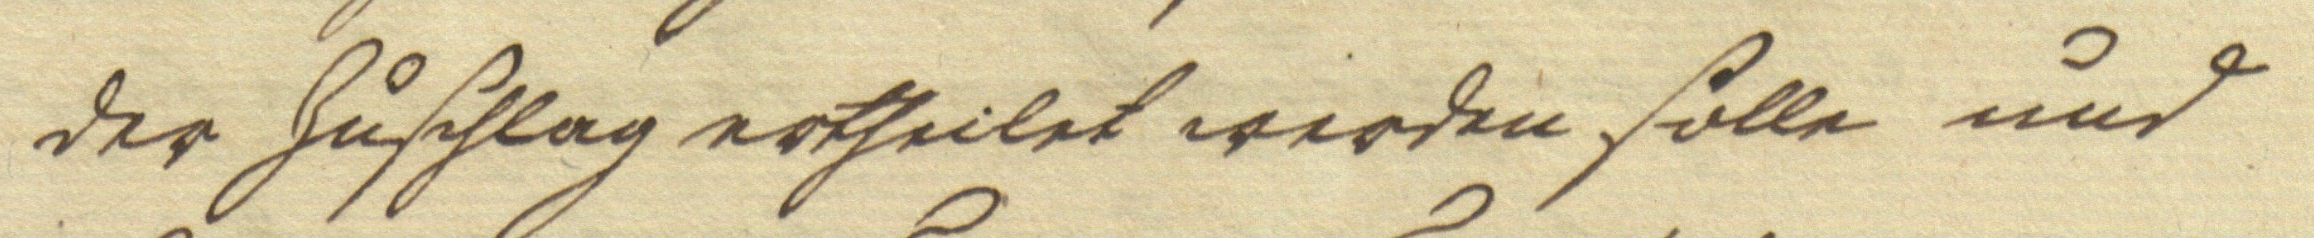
der Zuschlag ertheilet werden solle und
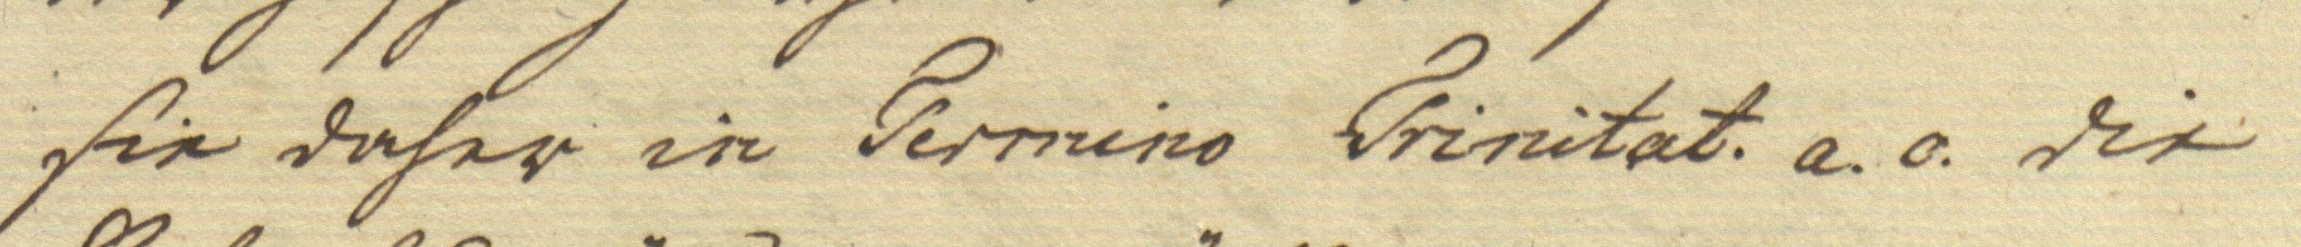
sie daher in Termino Trinitat. a. c. die
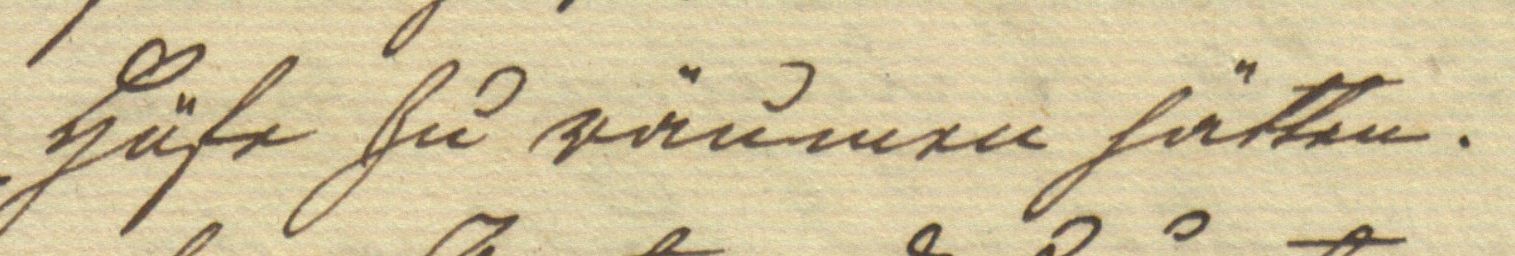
Höfe zu räumen hätten.
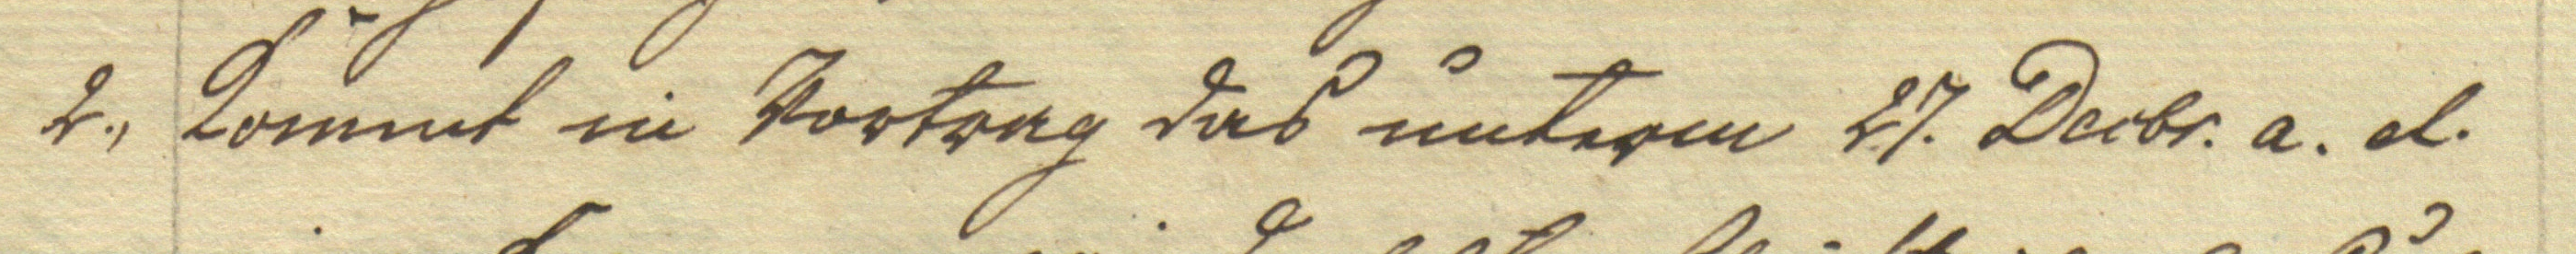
2., Kommt in Vortrag das unterm 27. Decbr. a. et.
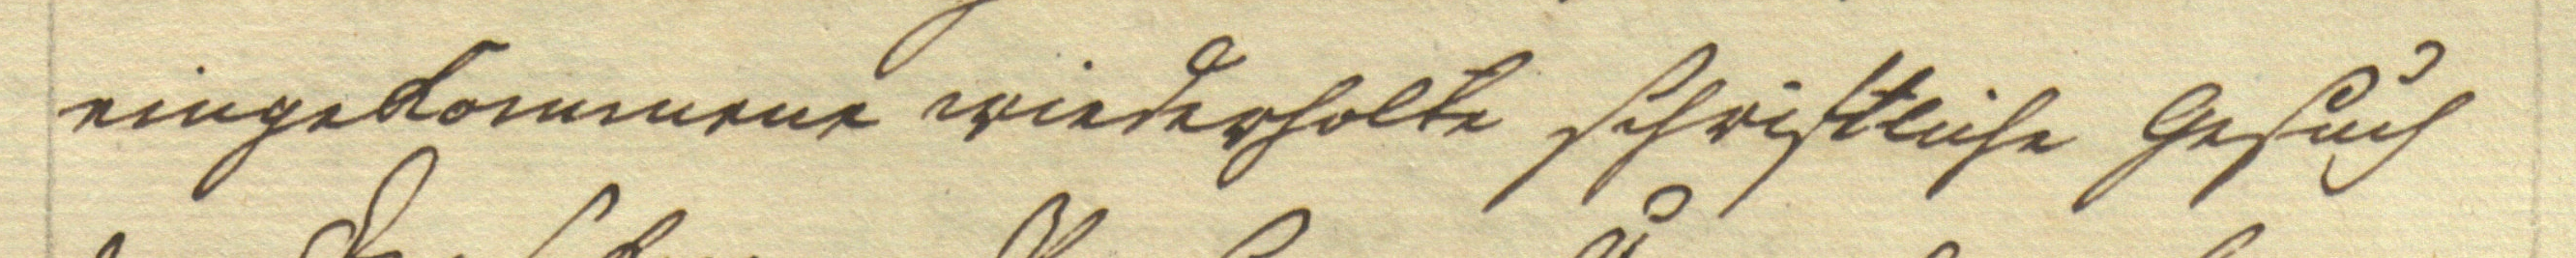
eingekommene wiederholte schriftliche Gesuch
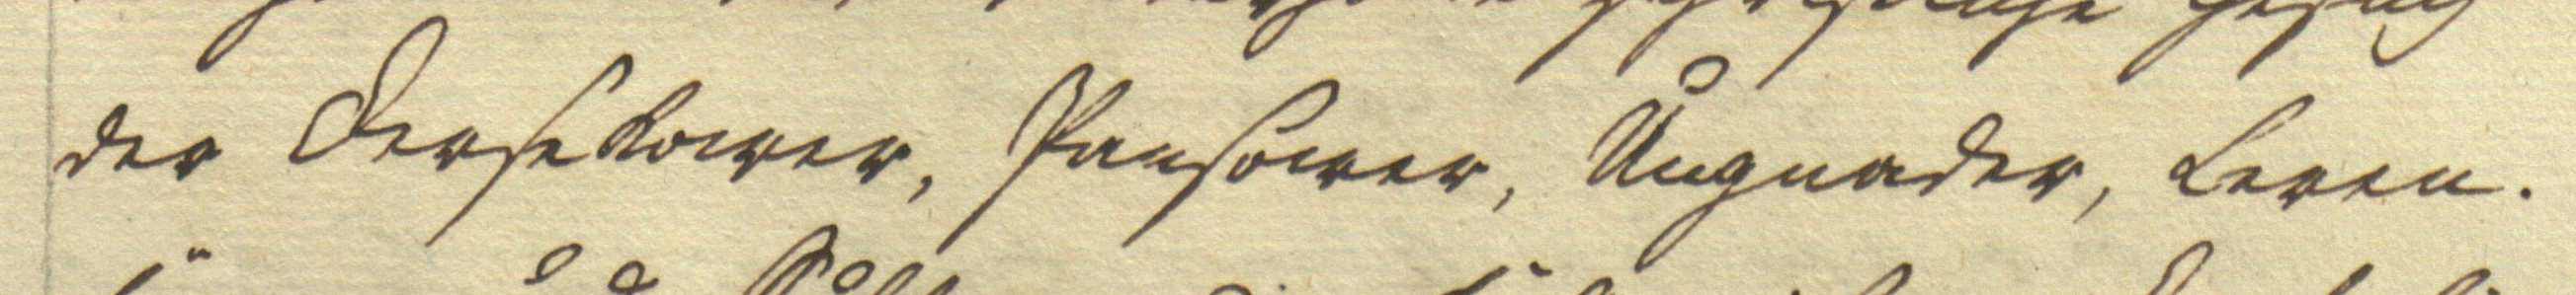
der Dersekower, Pansower, Ungnader, Leven¬
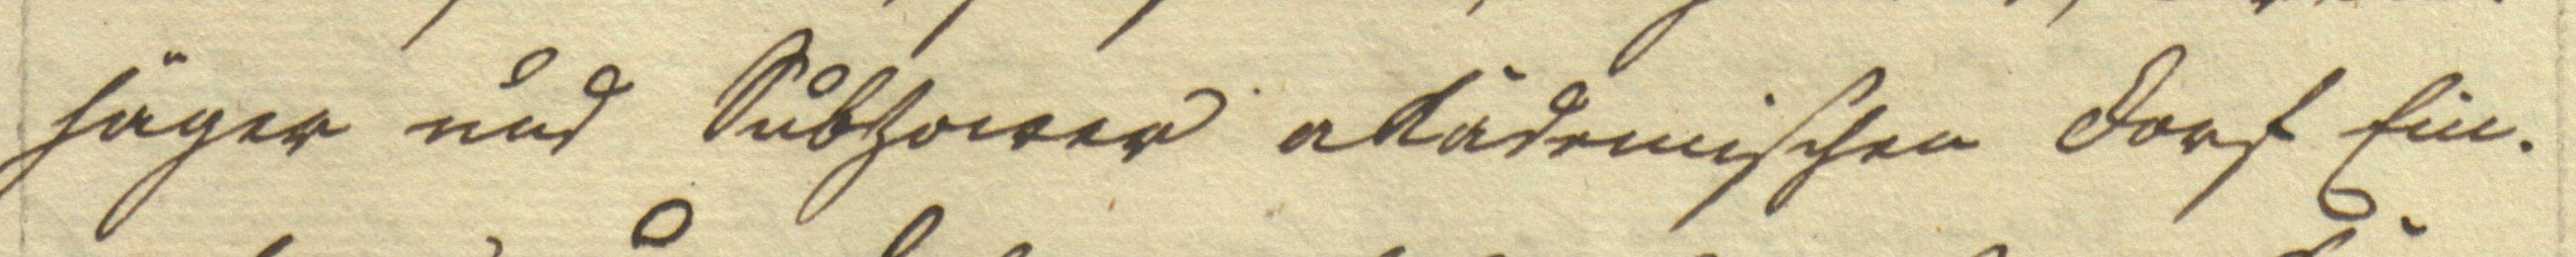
häger und Subzower akademischen Dorf Ein¬
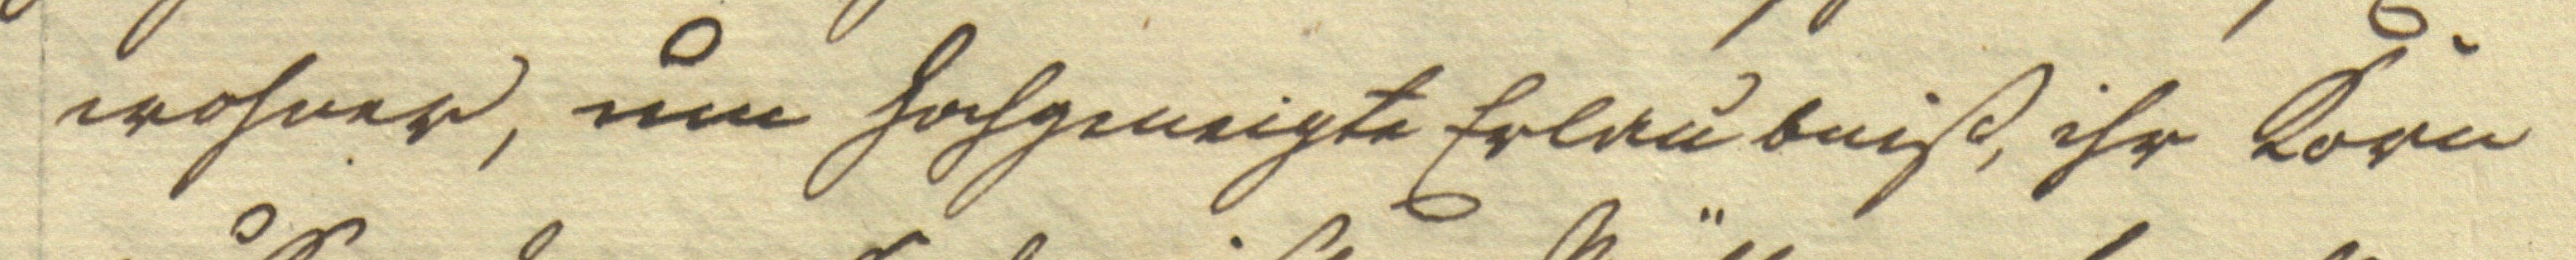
wohner, um Hochgeneigte Erlaubniß, ihr Korn
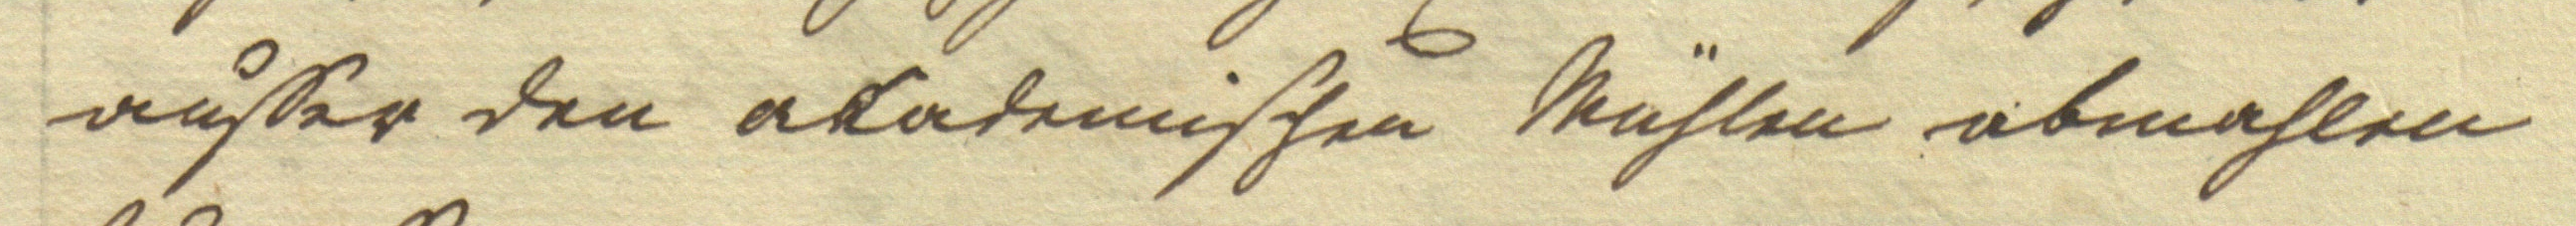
ausser den akademischen Mühlen abmahlen
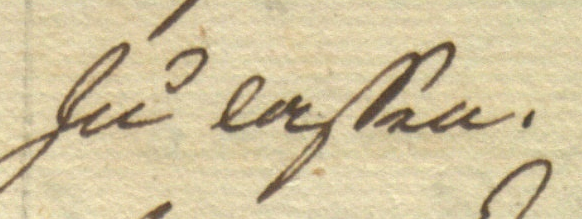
zu lassen.
